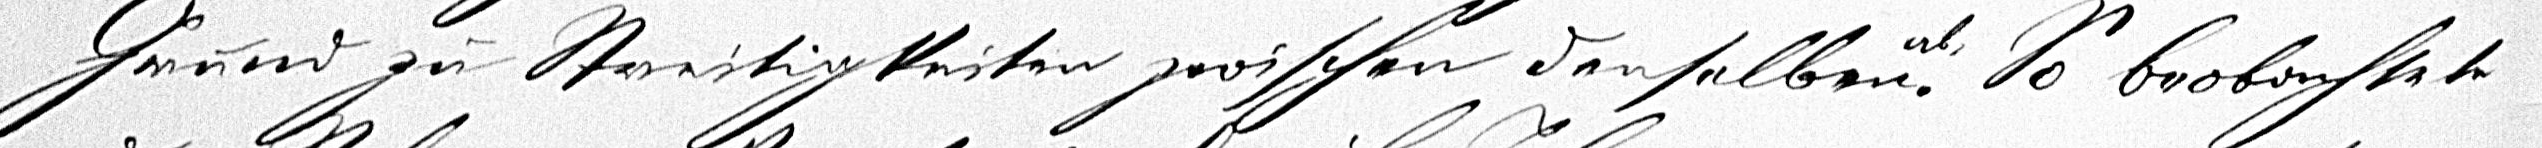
Grund zu Streitigkeiten zwischen denselben ab. So beobachtete
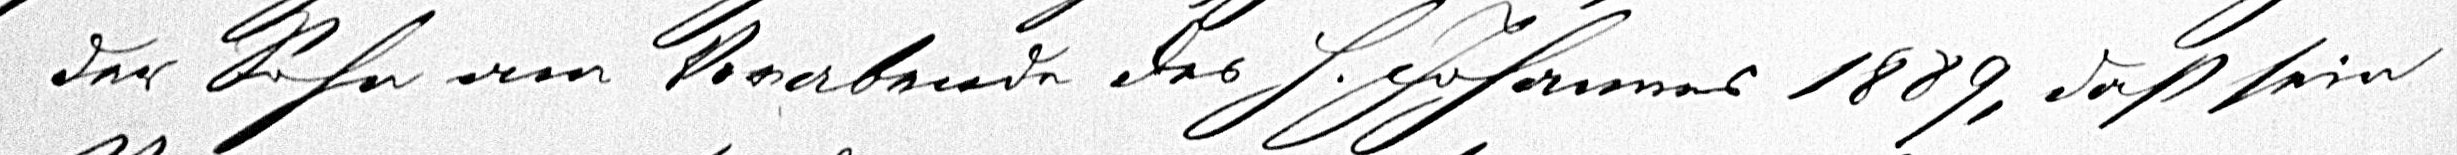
der Sohn am Vorabende des H. Johannes 1889, daß sein
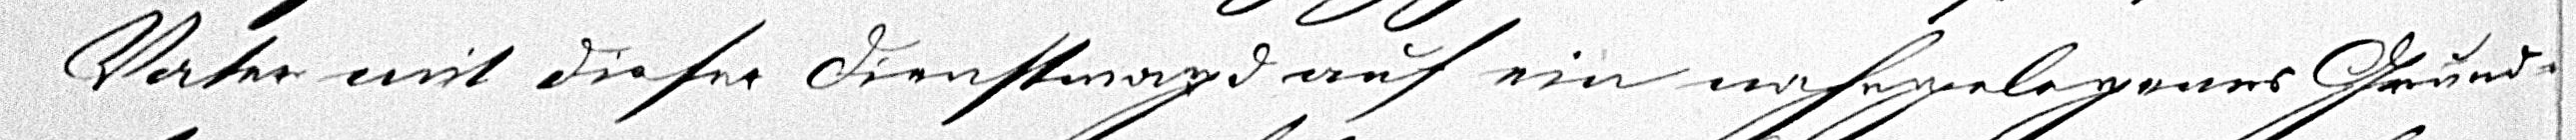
Vater mit dieser Dienstmagd auf ein nahegelegenes Grund¬
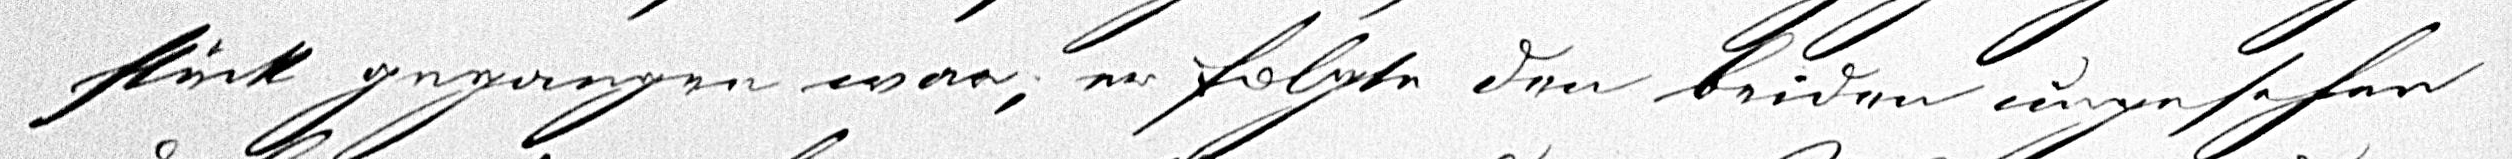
stück gegangen war, er folgte den beiden ungesehen
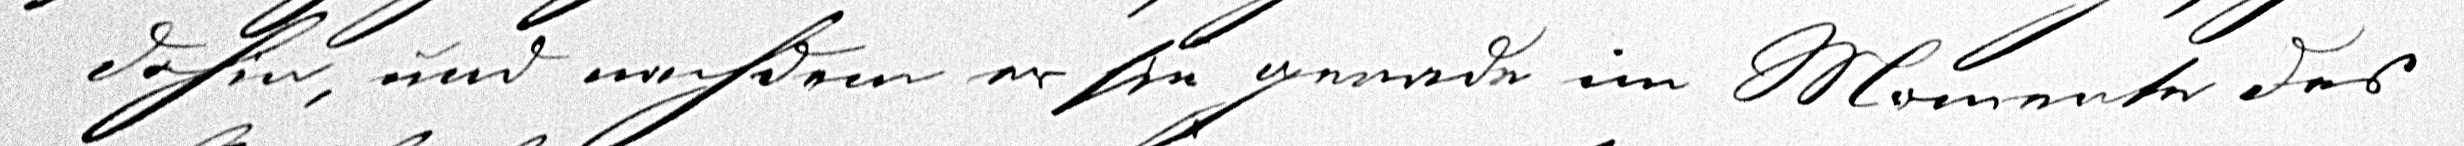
dahin, und nachdem er sie gerade im Momente des
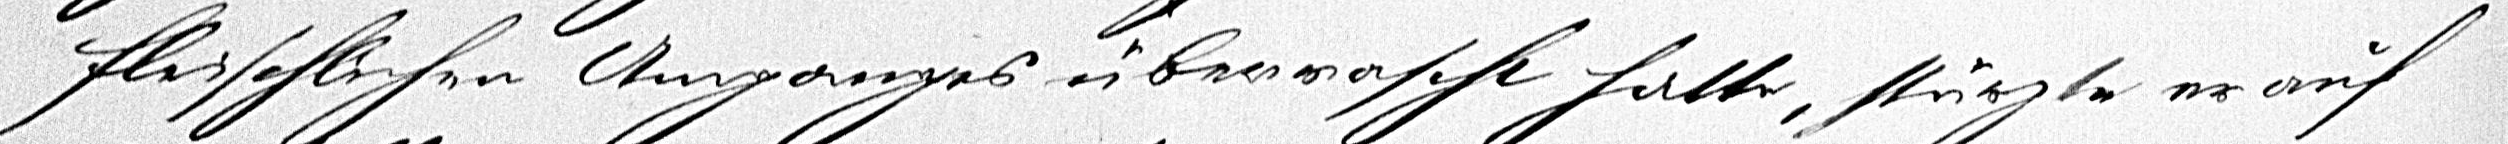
fleischlichen Anganges überrascht halte, stürzte er auf
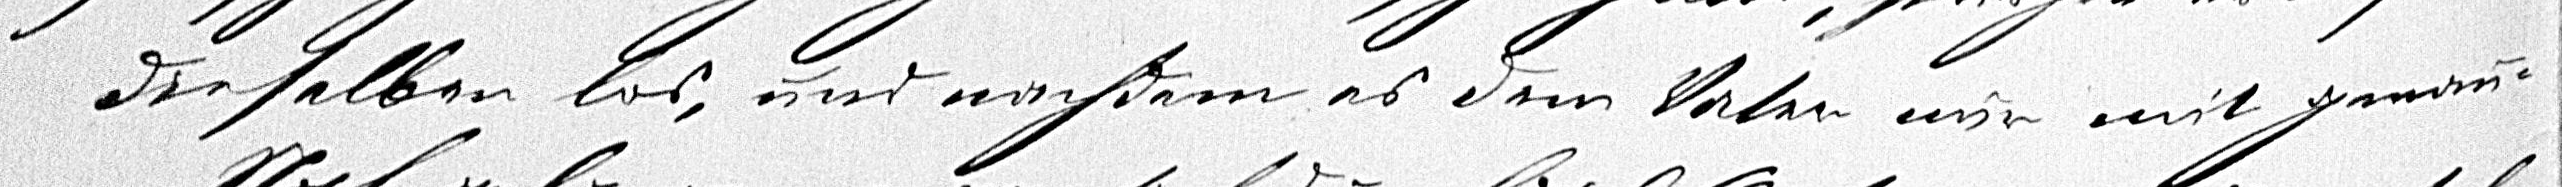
dieselben los, und nachdem es dem Vater nur mit genann¬
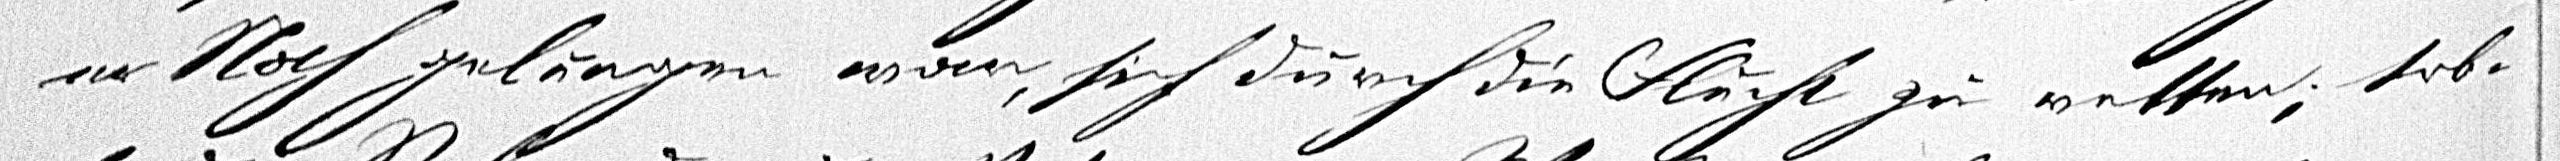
ter Noch gelungen war, sich durch die Flucht zu retten; tob¬
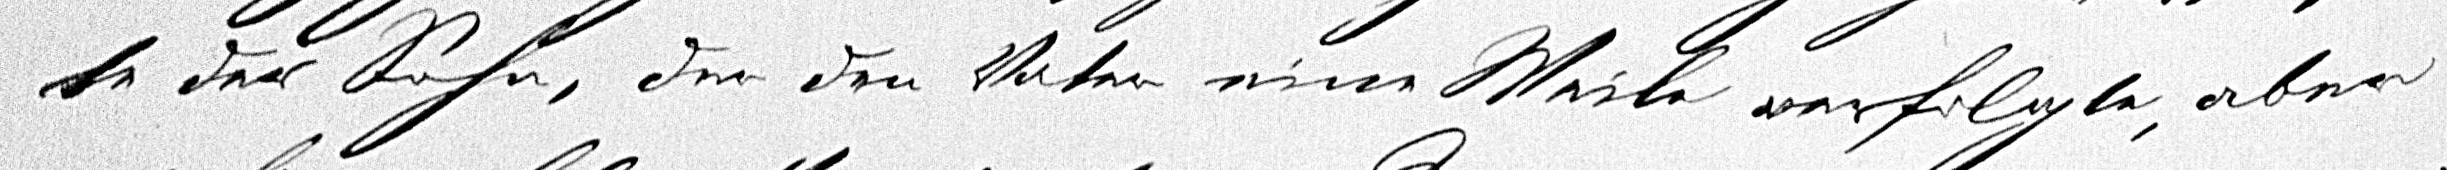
te der Sohn, der den Vater eine Weite verfolgte, aber
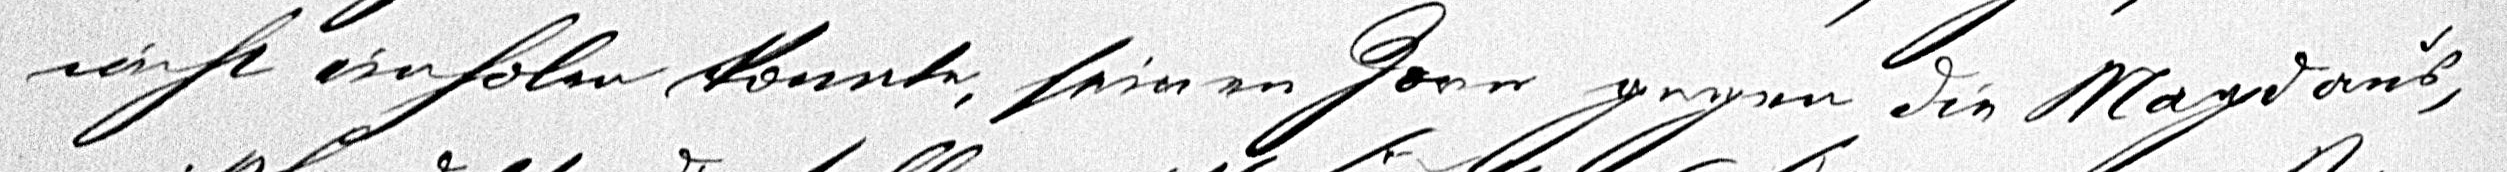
nicht einholen Konnte, seinen Zorn gegen die Magd aus,
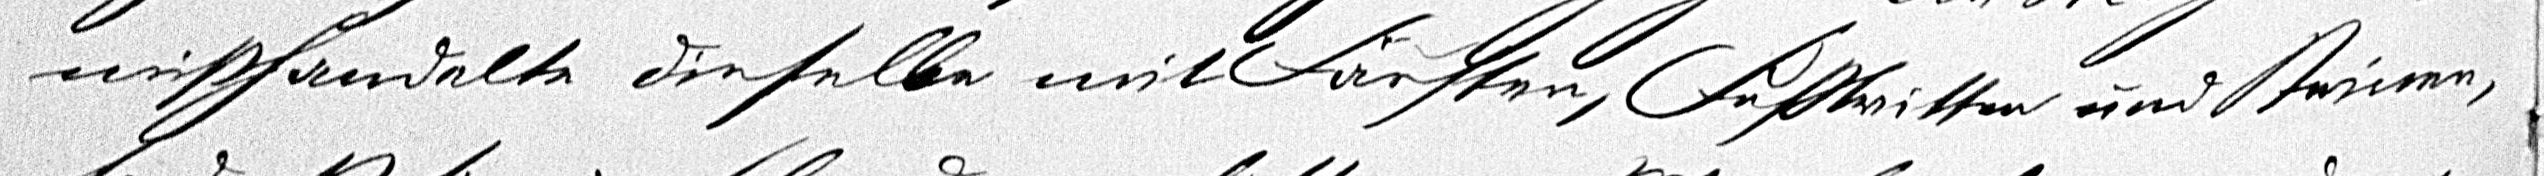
mißhandelte dieselbe mit Färsten, Fußtritten und Sturme,
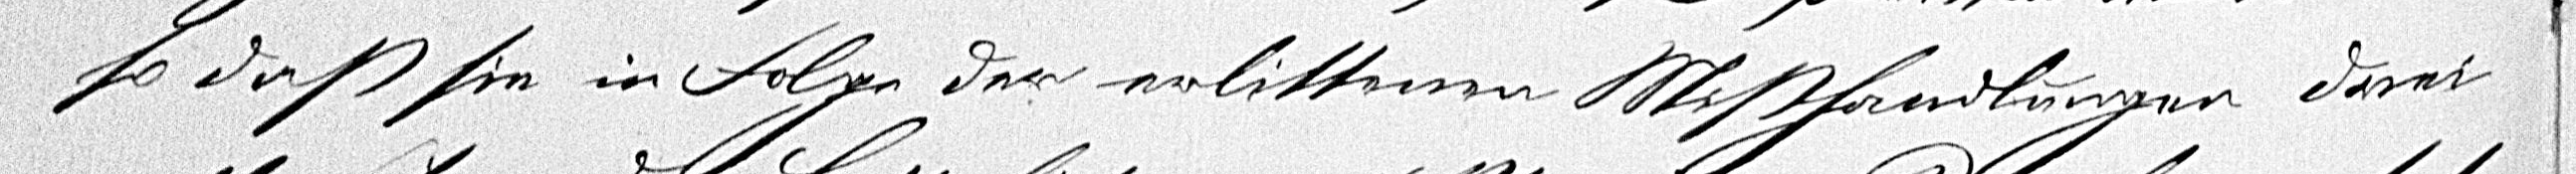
so daß sie in Folge der erlittenen Mißhandlungen drei
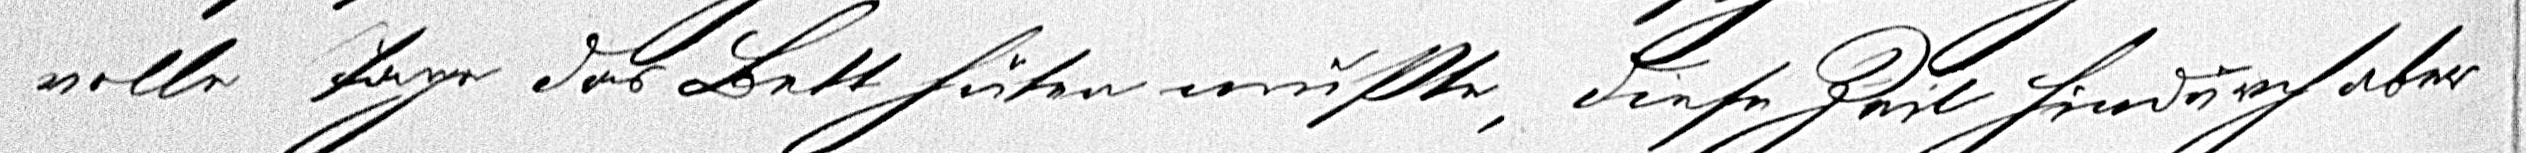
volle Tage das Bett hüten mußte, diese Zeit hindurch aber
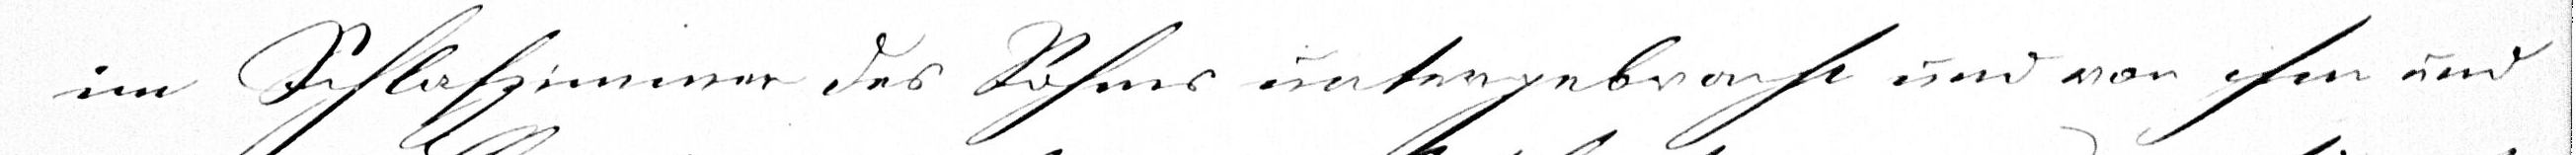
im Schlafzimmer des Sohnes untergebracht und von ihm und
